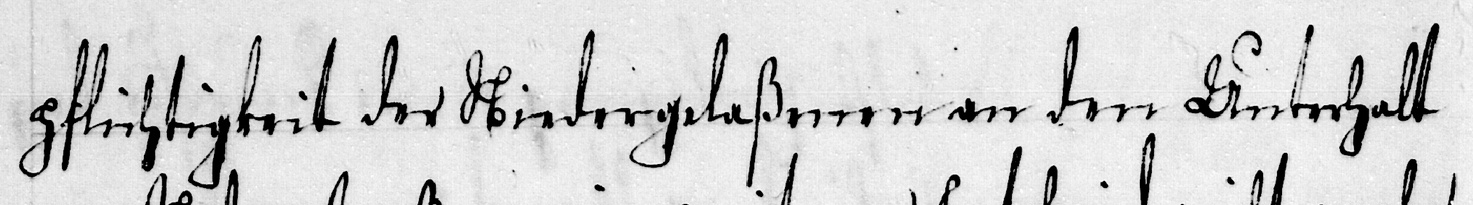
pflichtigkeit der Niedergelaßenen an den Unterhalt
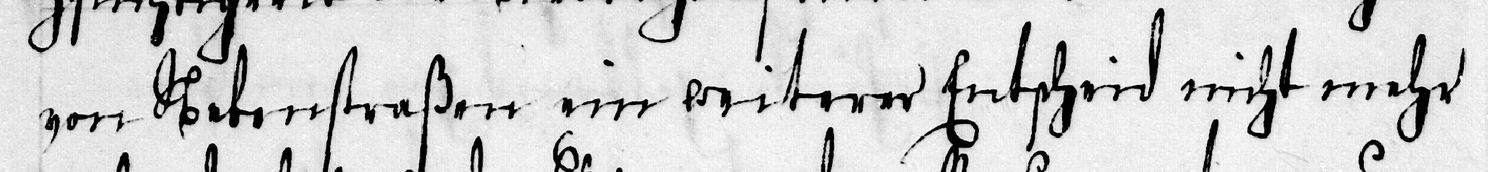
von Nebenstraßen ein weiterer Entscheid nicht mehr
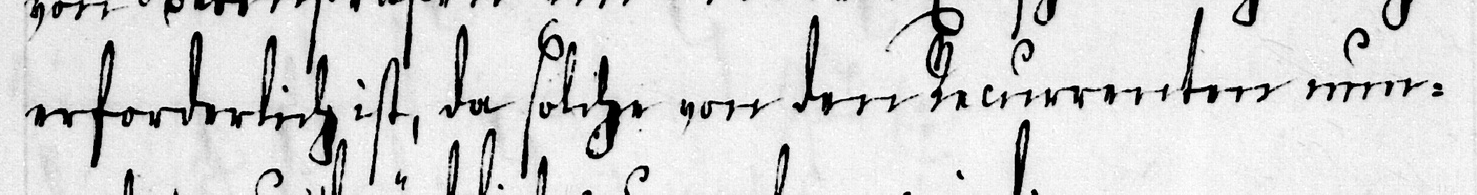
erforderlich ist, da solche von den Recurrenten nun¬
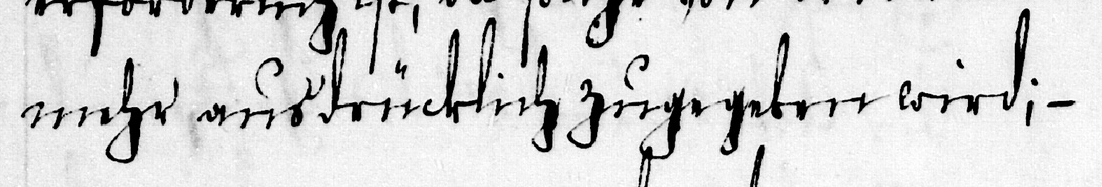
mehr ausdrücklich zugegeben wird; –
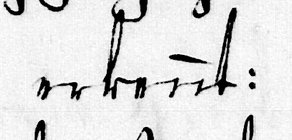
erkennt:
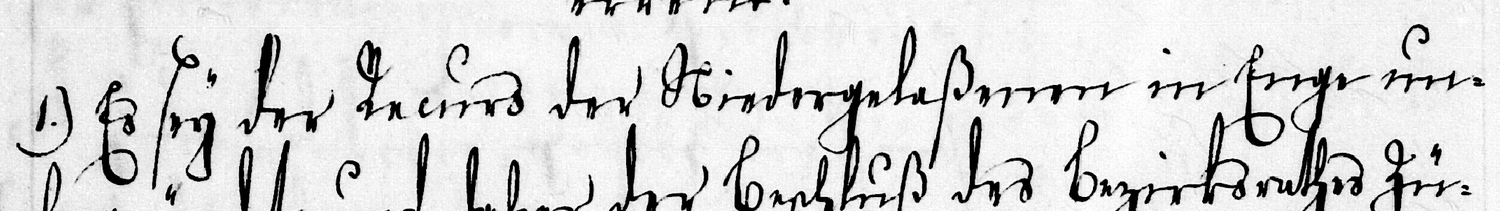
1.) Es sey der Recurs der Niedergelaßenen in Enge un¬
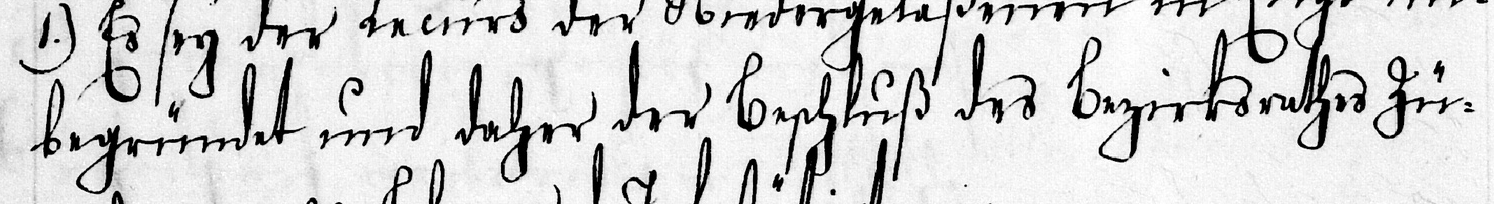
begründet und daher der Beschluß des Bezirksrathes Zü¬
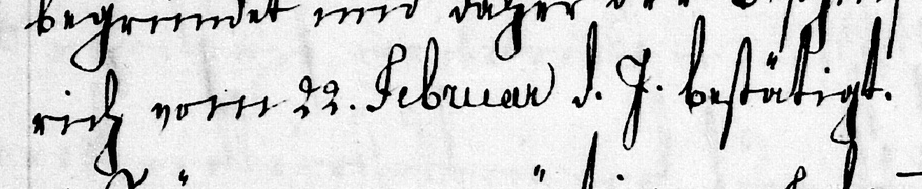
rich vom 22. Februar d. J. bestätigt.
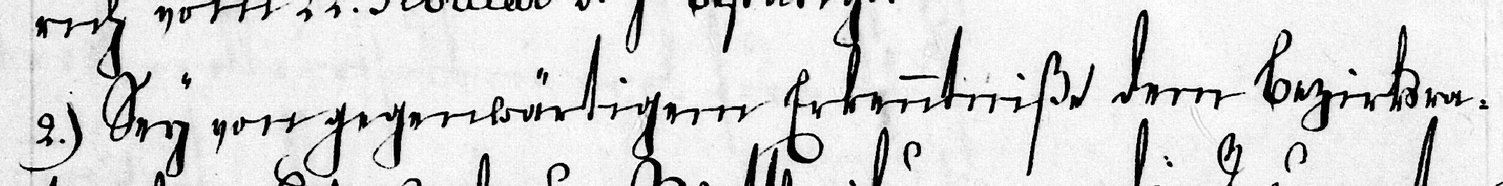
2.) Sey von gegenwärtigem Erkenntniße dem Bezirksra¬
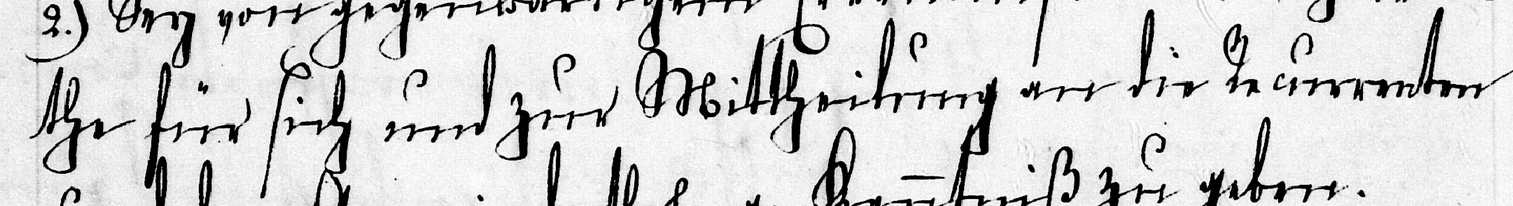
the für sich und zur Mittheilung an die Recurrenten
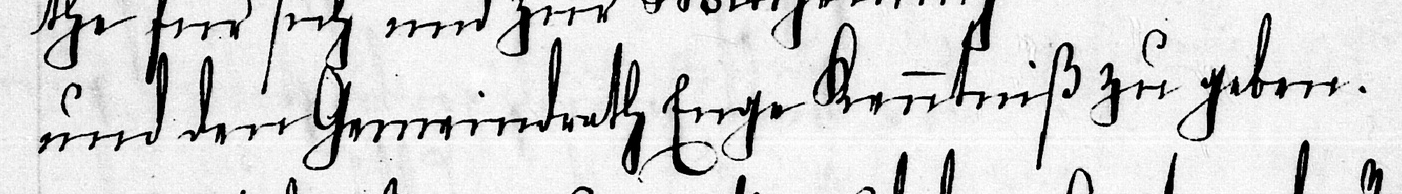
und den Gemeindrath Enge Kenntniß zu geben.
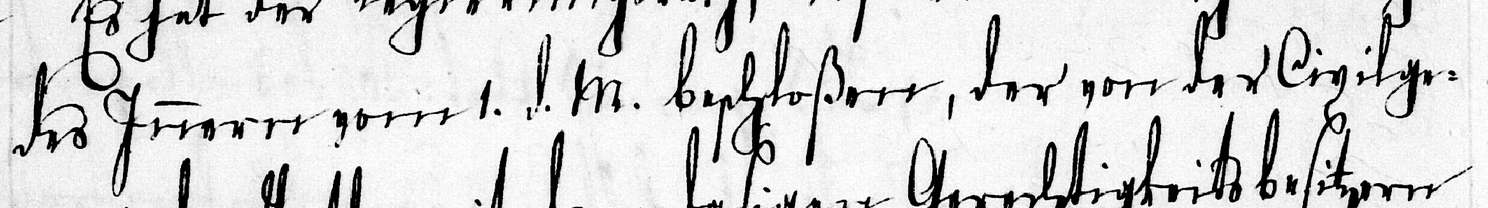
des Innern vom 1. d. M. beschloßen, der von der Civilge¬
